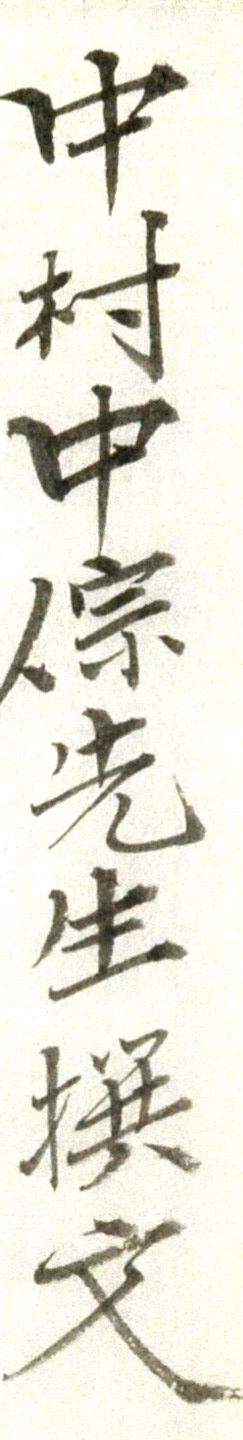中村中倧先生撰文
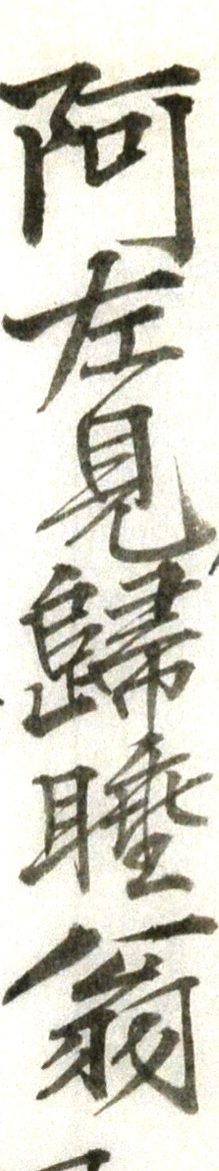阿左見帰睡翁

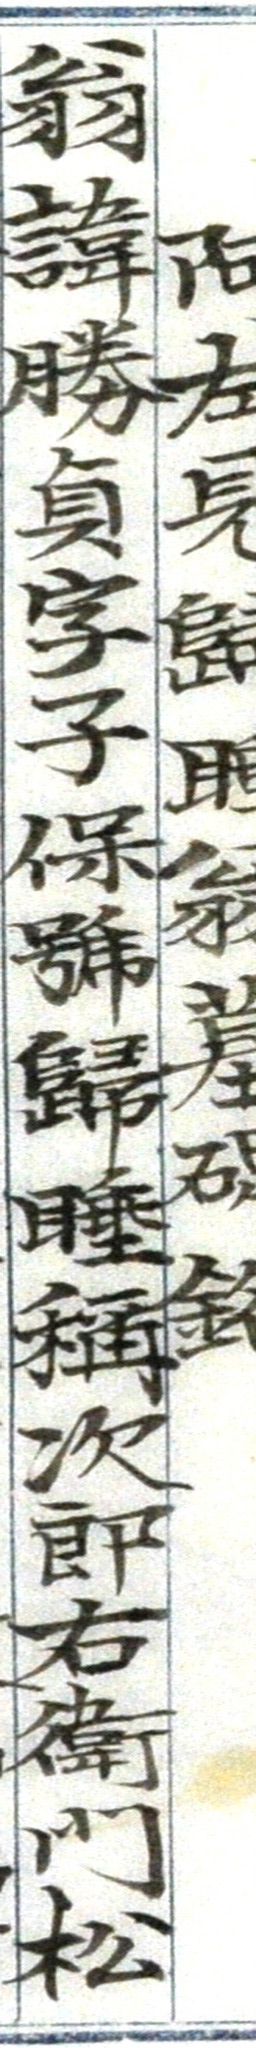翁諱勝負字子保号帰睡称次郎右衛門松
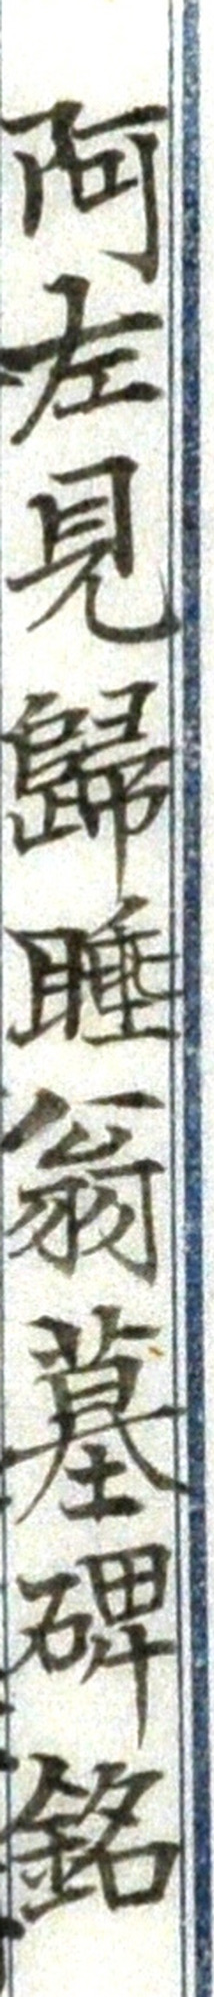阿左見帰睡翁墓碑銘
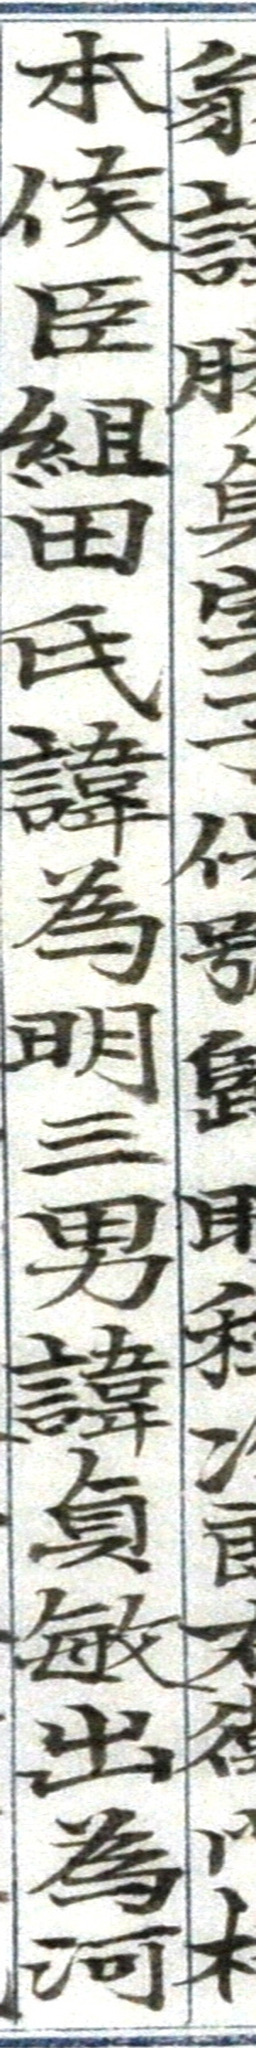本侯臣組田氏諱為明三男諱負敏出為河
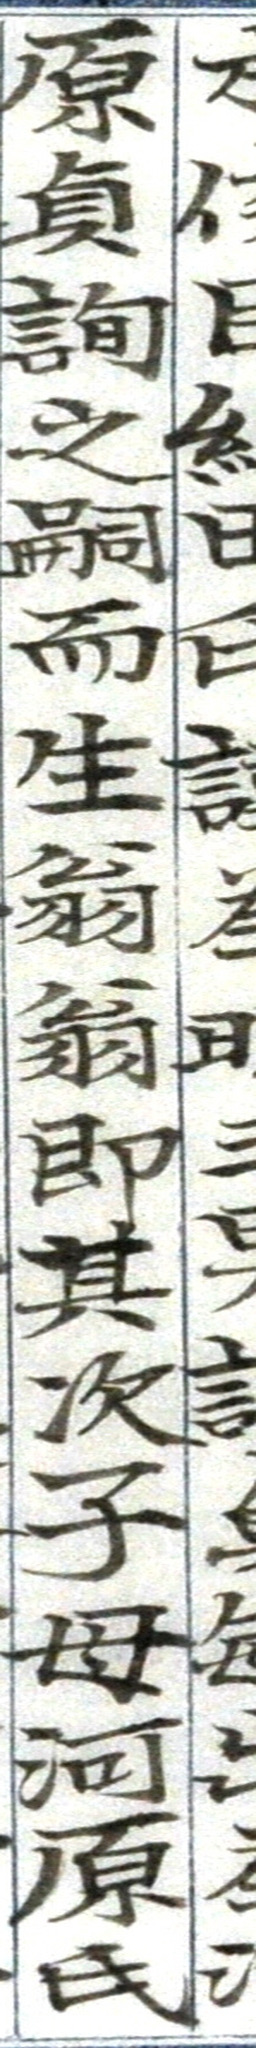原負詢之嗣而生翁翁即其次子母河原氏
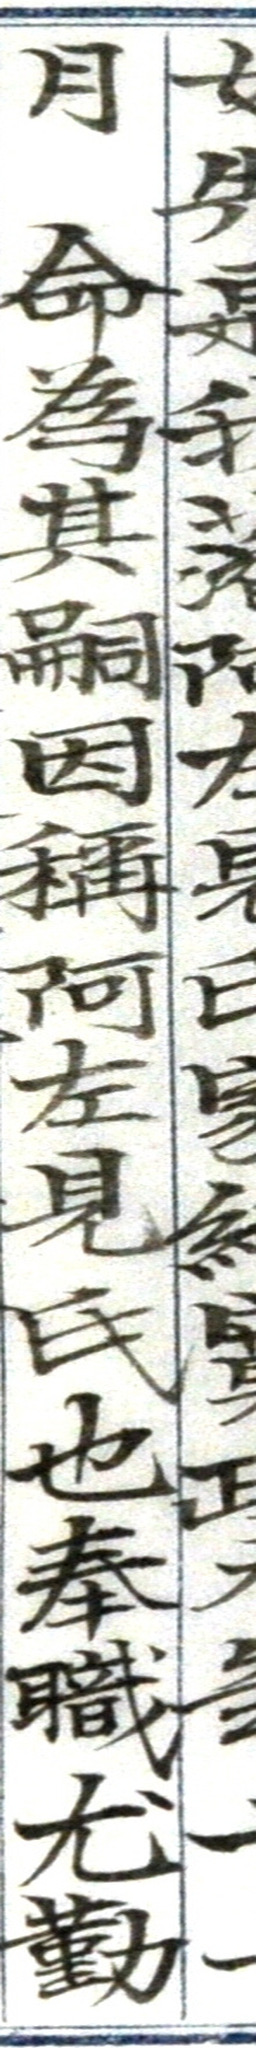月命為其嗣因称阿左見氏也奉職尤勤
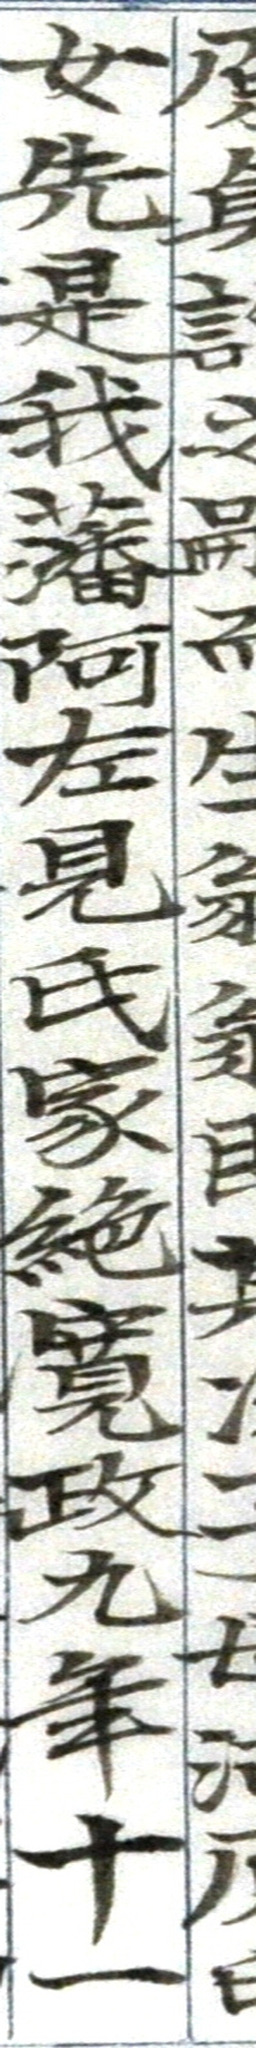女先是我藩阿左見氏家絶寛政九年十一
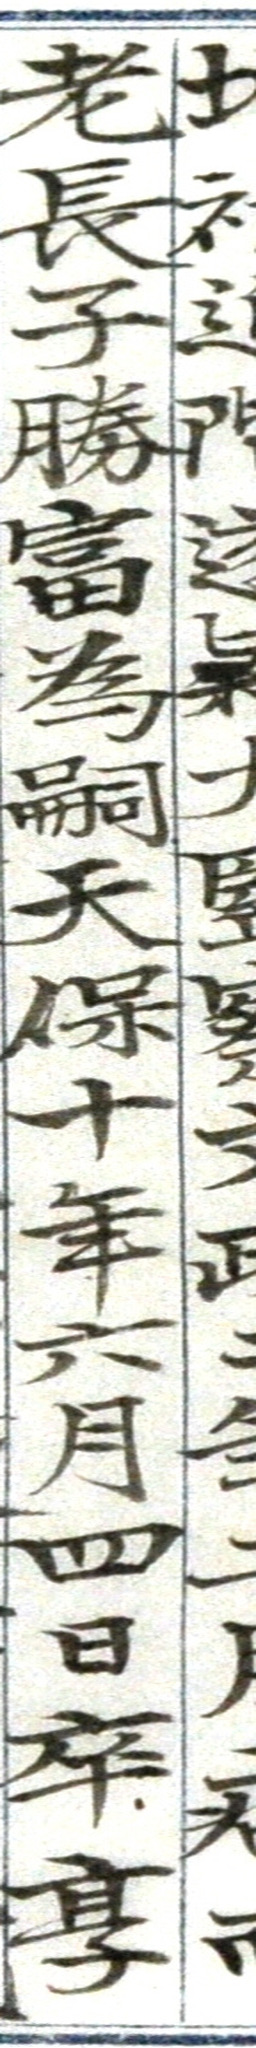老長子勝富為嗣天保十年六月四日卒享
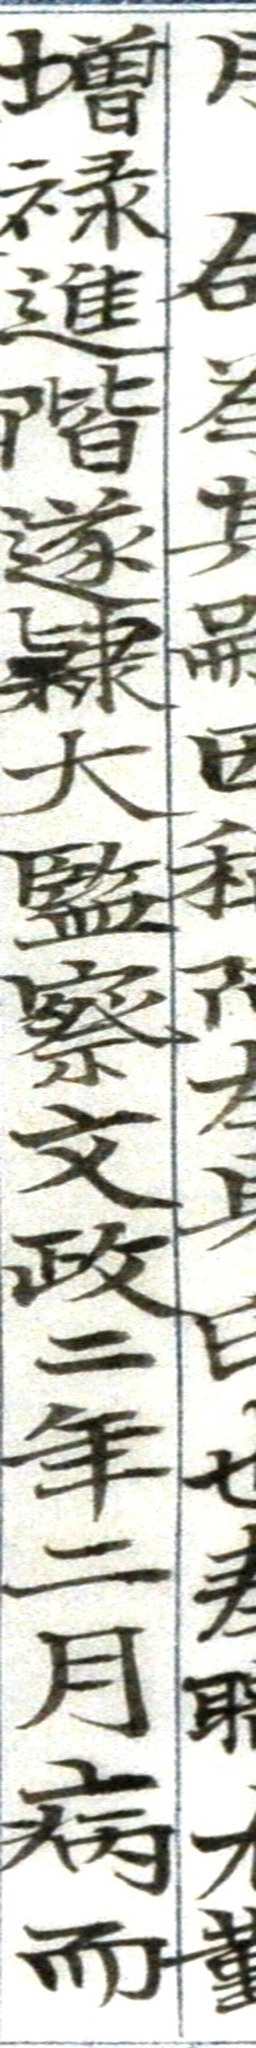増禄進階逐大監察文政二年二月病而
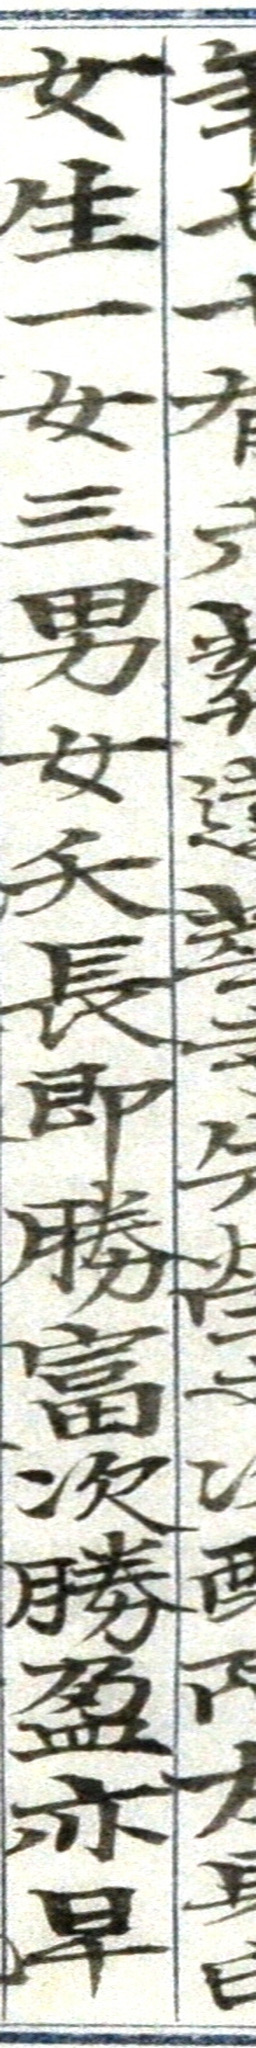女生一女三男女夭長即勝富次勝盈亦早
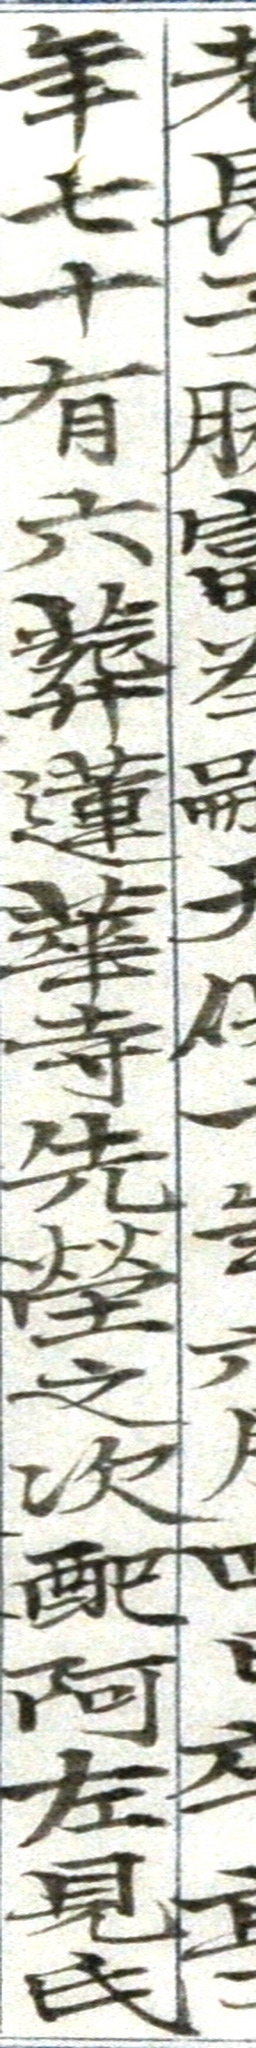年七十有六葬蓮華寺先塋之次配阿左見氏
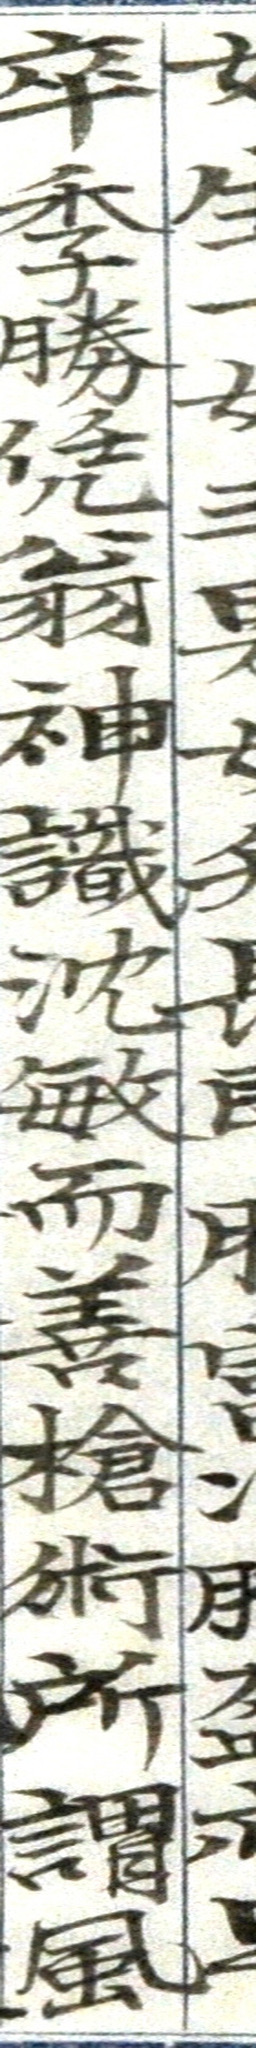卒季勝凭翁神識沈敏而善槍術所謂風
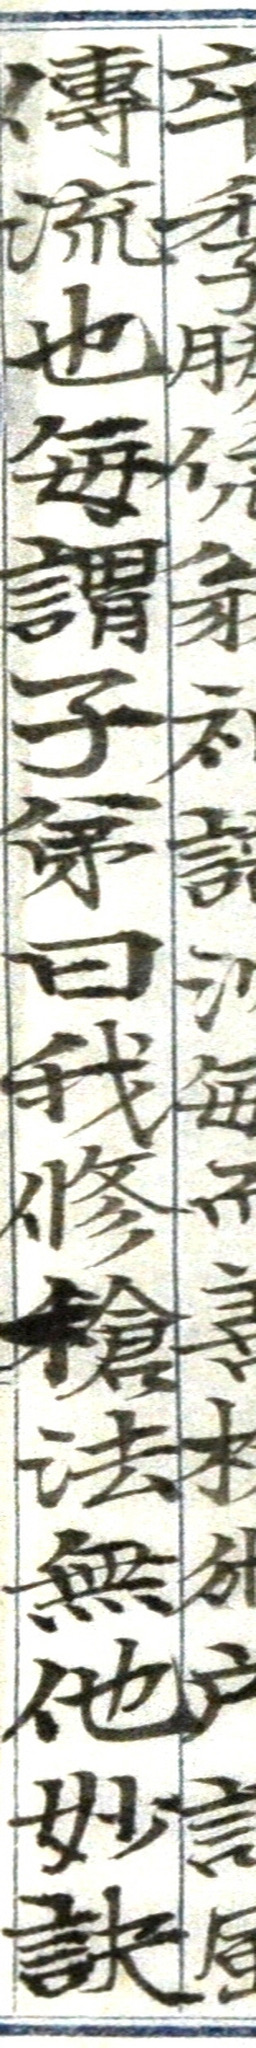博流也毎謂子第曰我修槍法無他妙訣

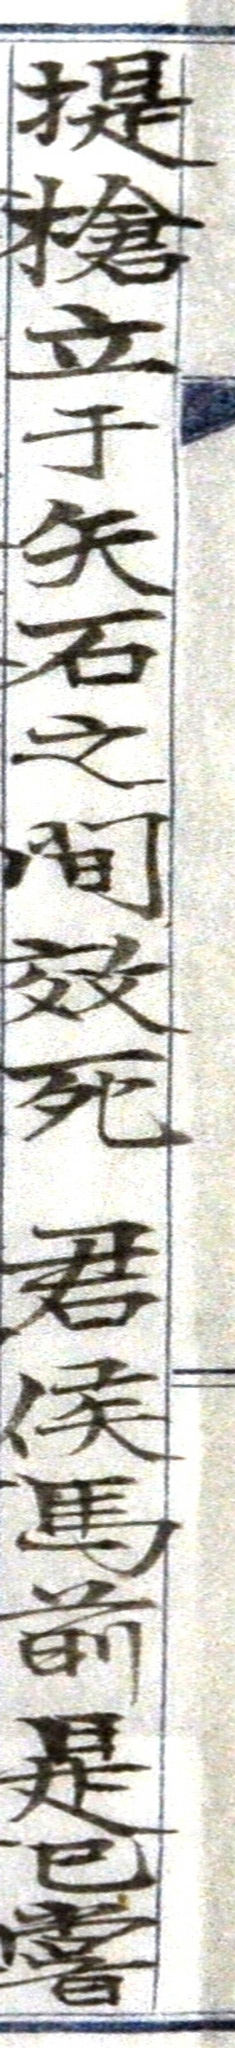堤槍立于矢石之間致死君候馬前是巳嘗
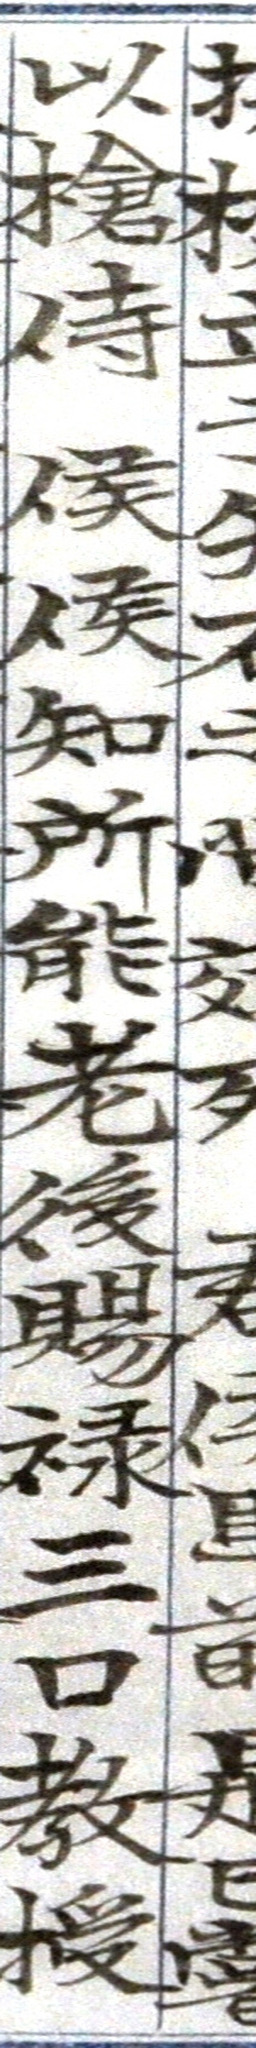以槍侍候候知所能老後賜禄三口教授
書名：阿左見帰睡翁・佐藤薫谷先生碑文
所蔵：伊那市立高遠町図書館・合同会社AMANE
